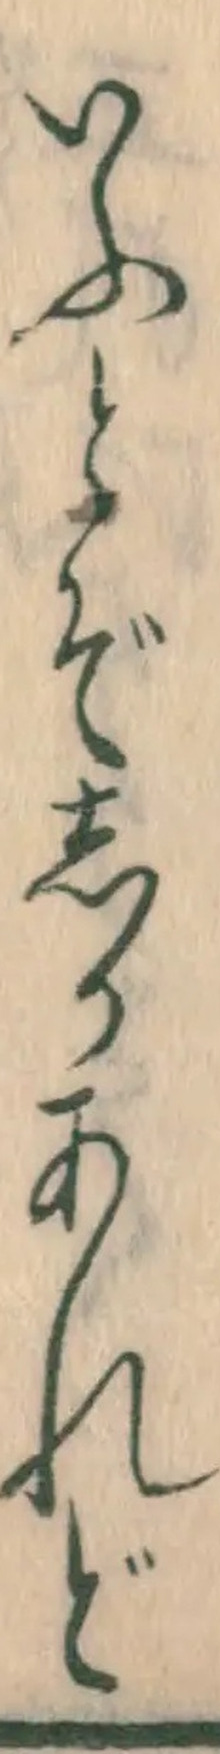いふとぞしかあれど
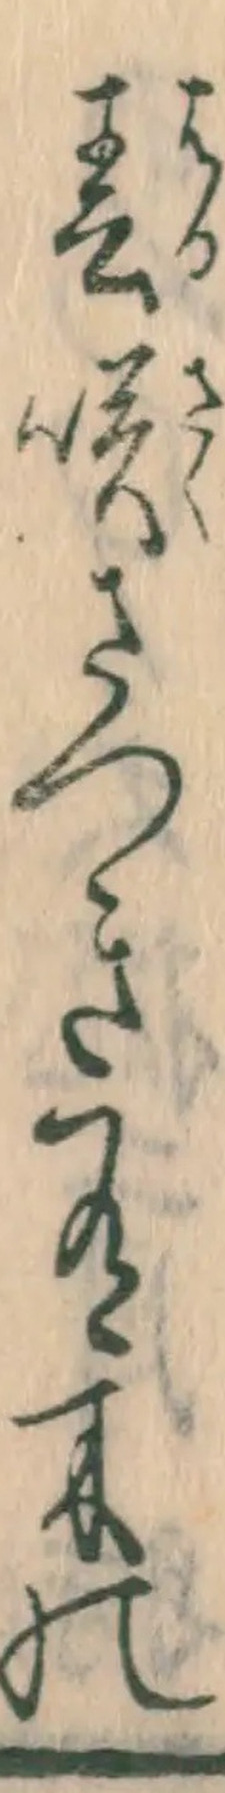春咲さつき有木の
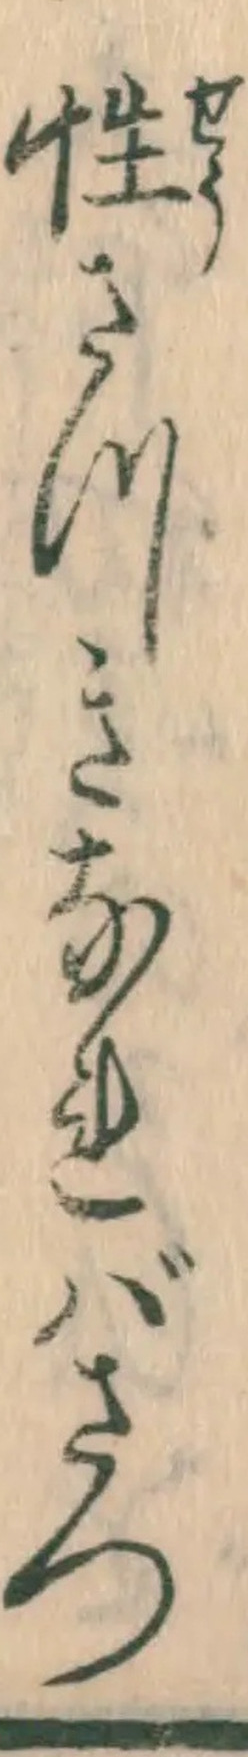性さつきなればさつ
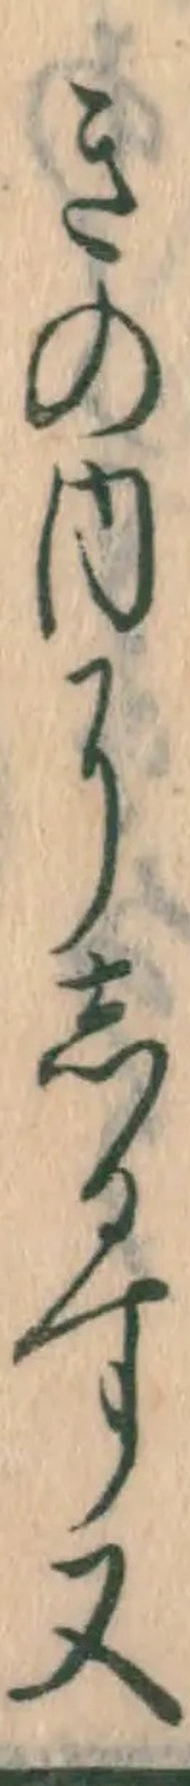きの門にしるす又
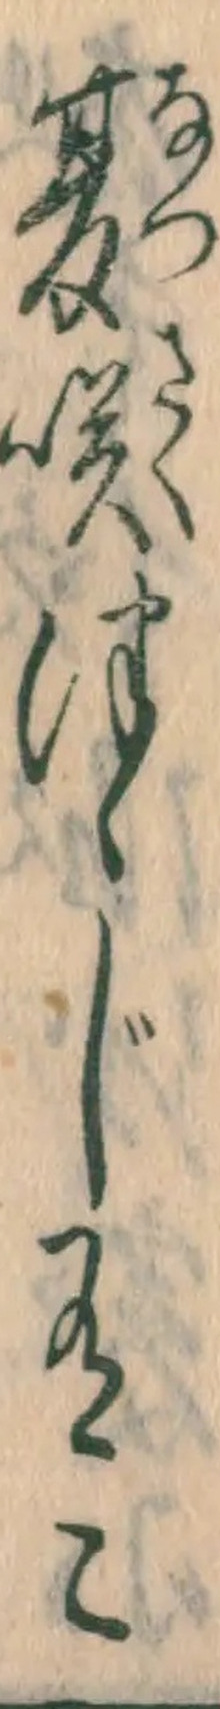夏咲つゝじ有こ
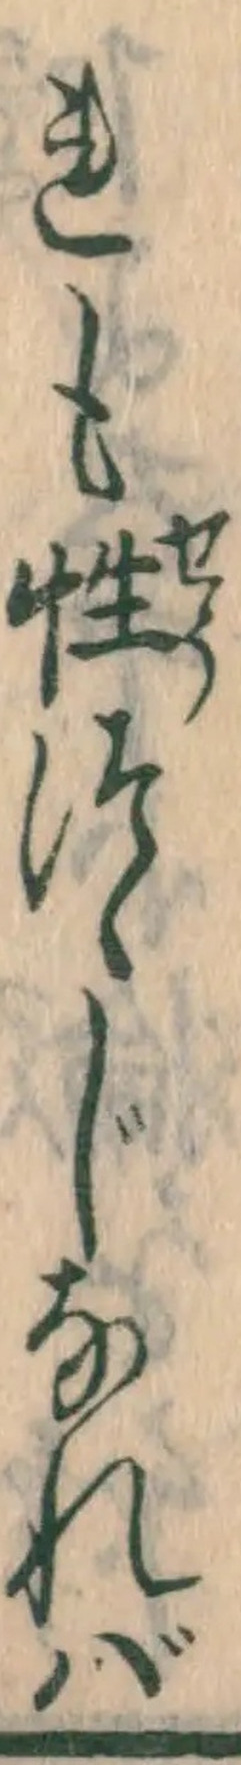れも性つゝじなれば
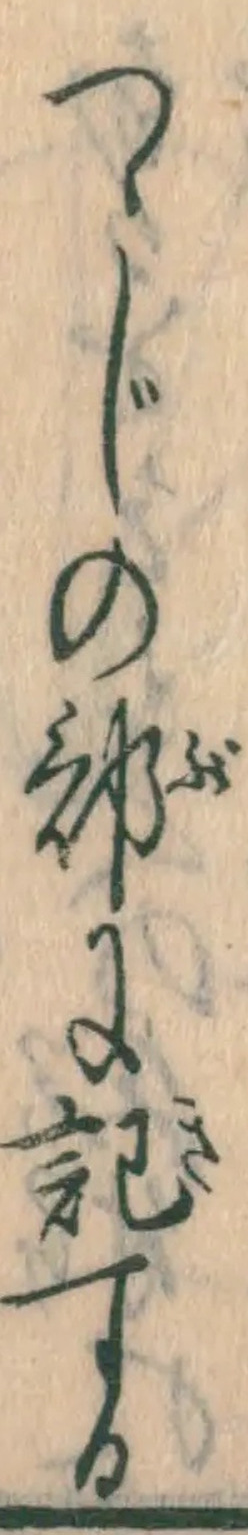つゝじの部に記する
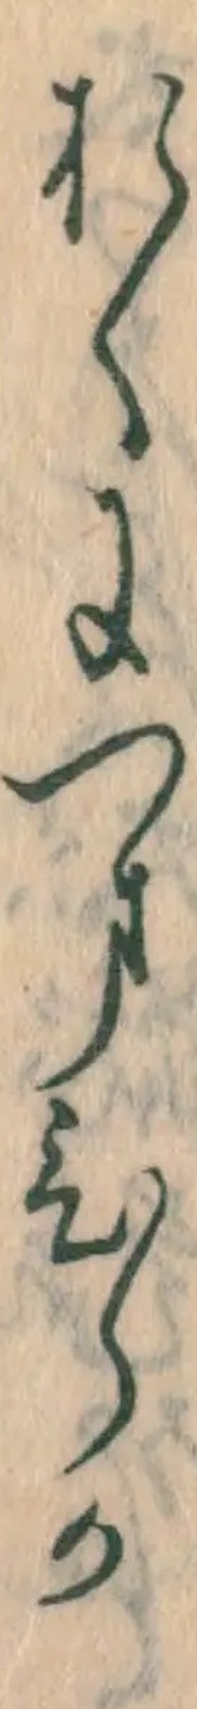おくにつまひらか

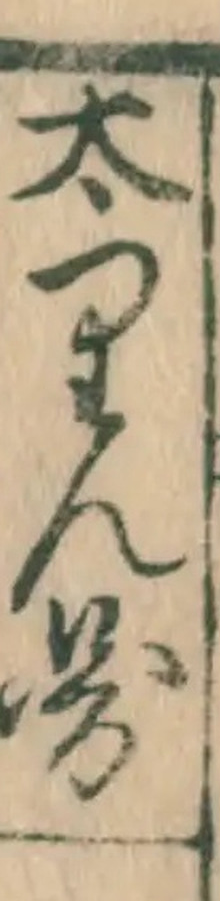太りん図
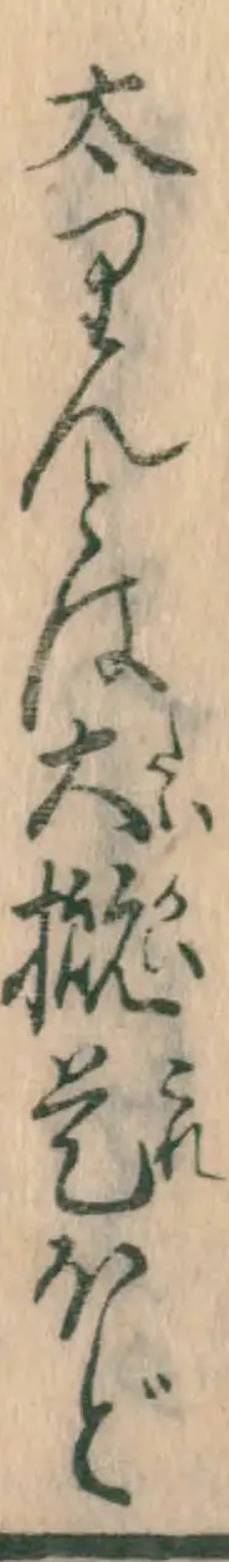太りんとは大概是ほど
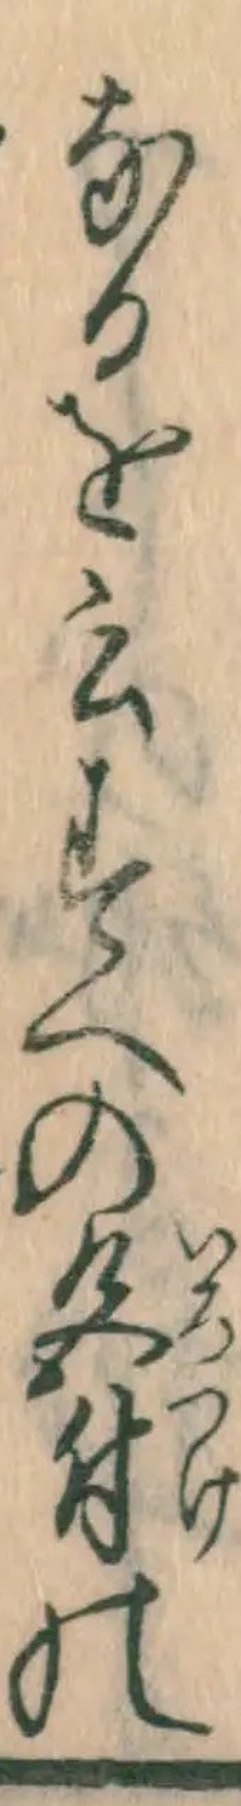なるを云すへの色付の
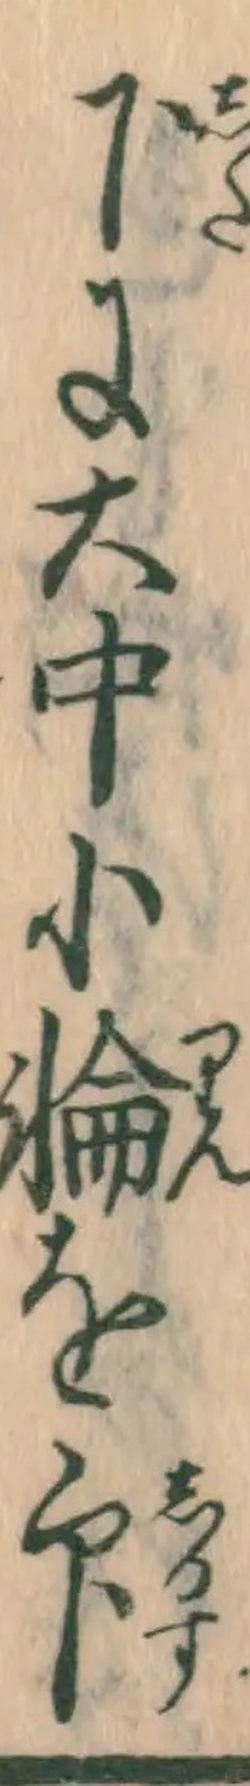下に大中小輪を印
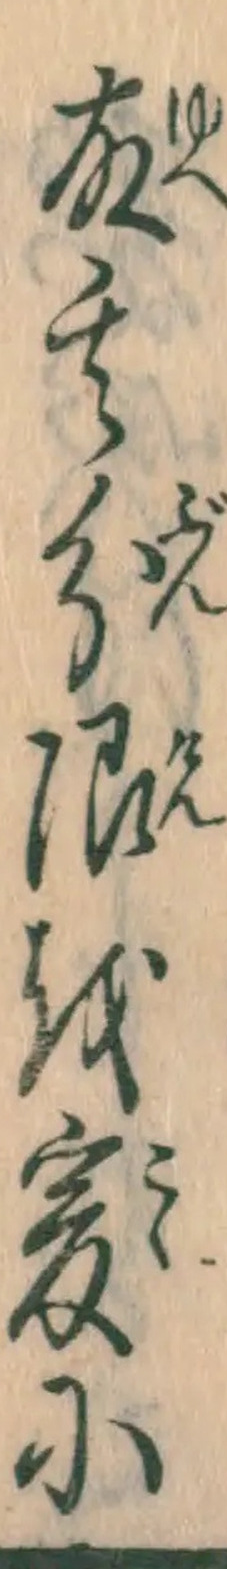故其分限を爰に
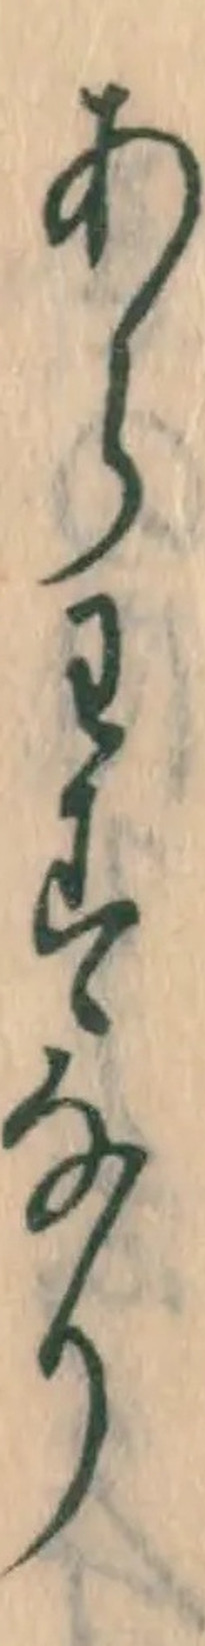あらわすなり
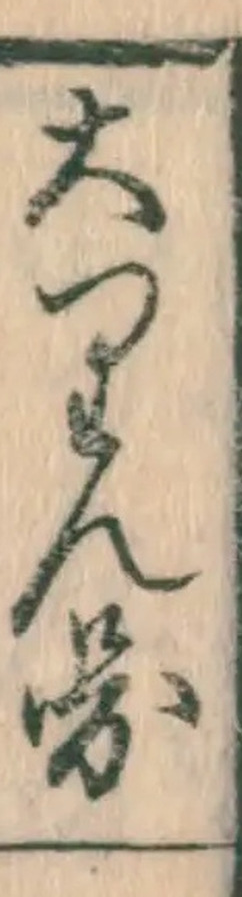大りん図
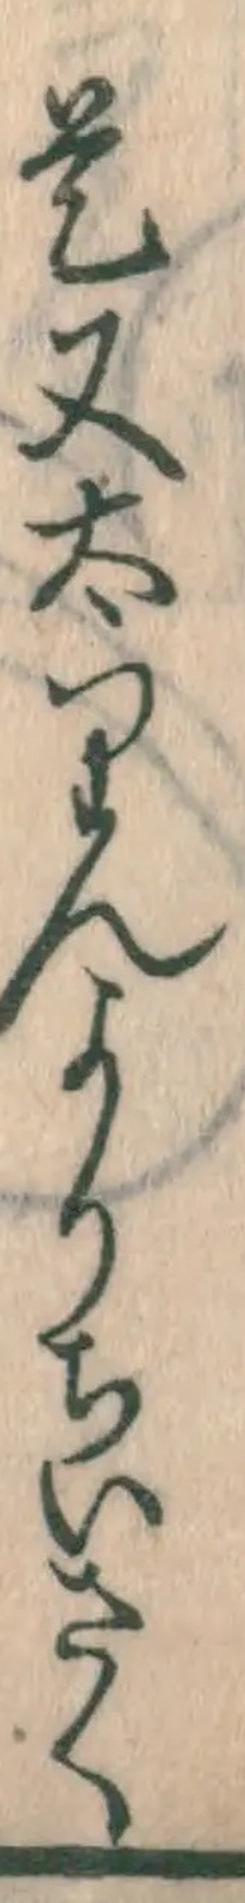是又太りんよりちいさく
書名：錦繍枕 5巻. [1]
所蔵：国立国会図書館 National Diet Library, JAPAN
